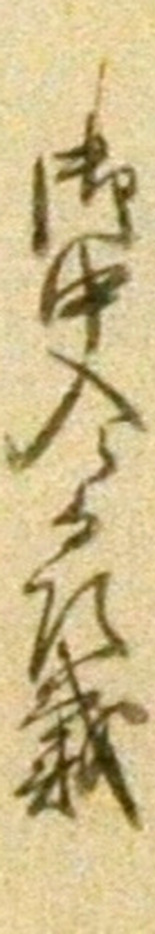御中入ニ而頂戴
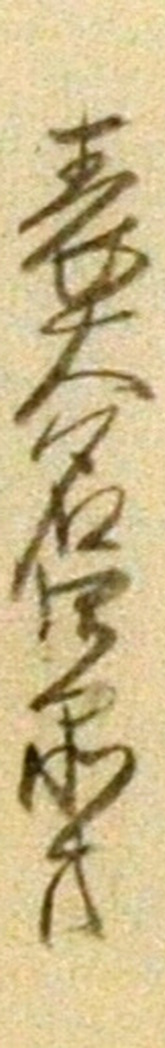表大名四品方
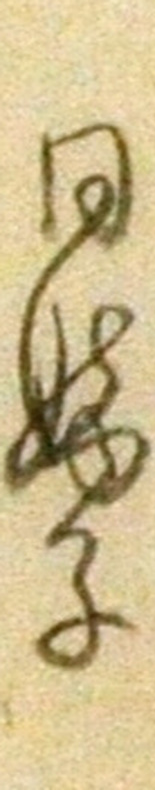同嫡子
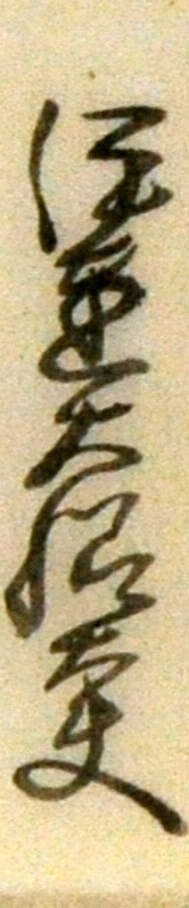煩伊達大膳大夫

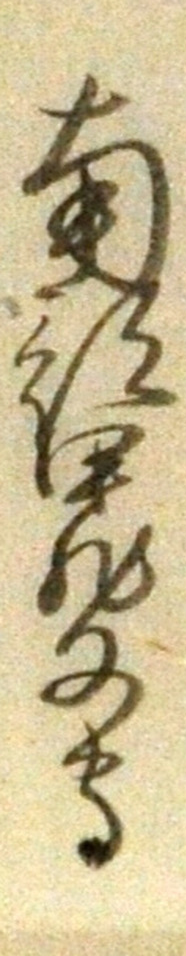南部甲斐守
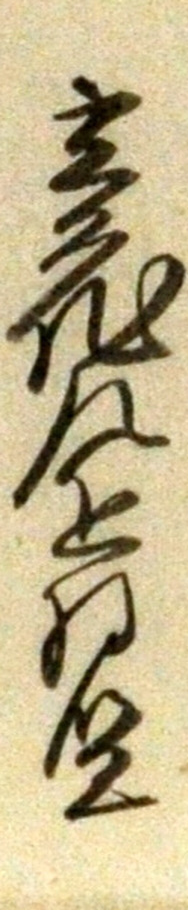煩立花左近将監
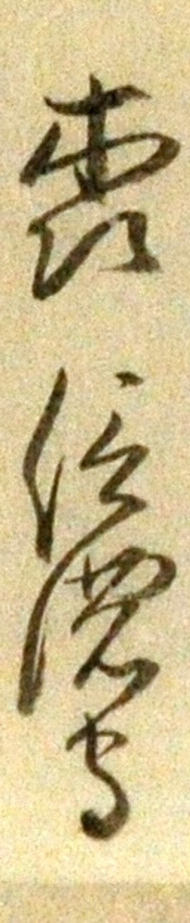森信濃守
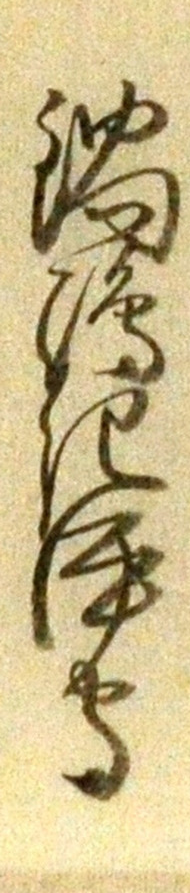鍋嶋紀伊守
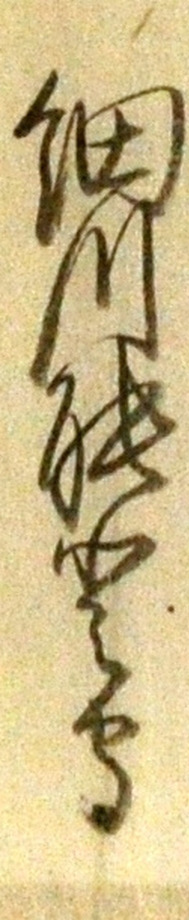煩細川能登守
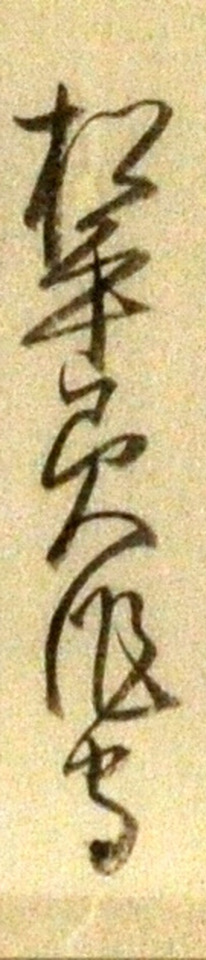松平美作守
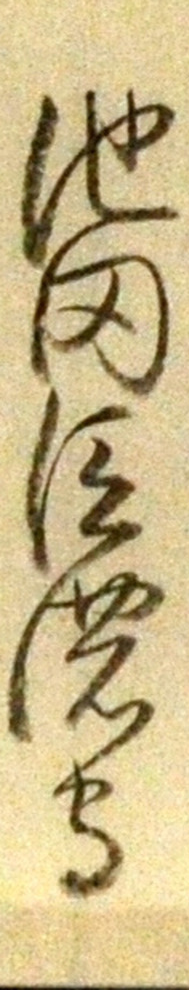忌池田信濃守

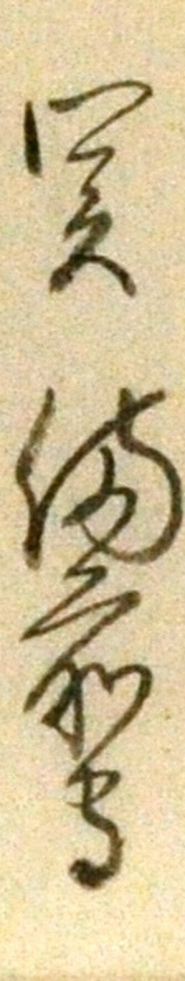関備前守
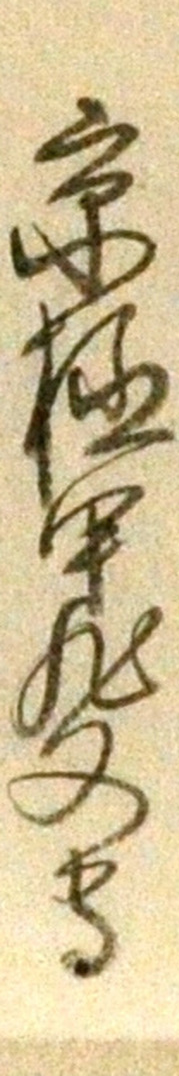京極甲斐守
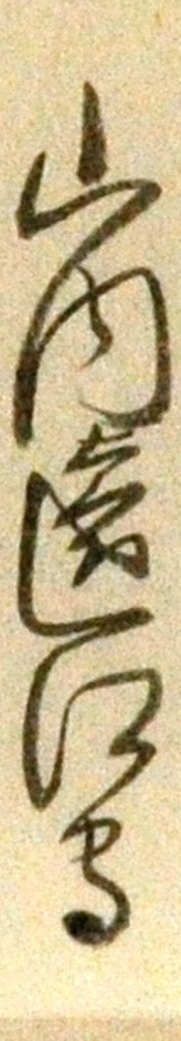山内遠江守
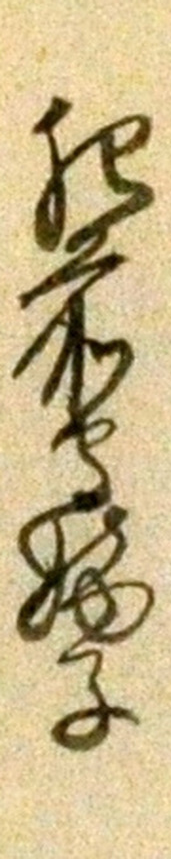肥前守嫡子
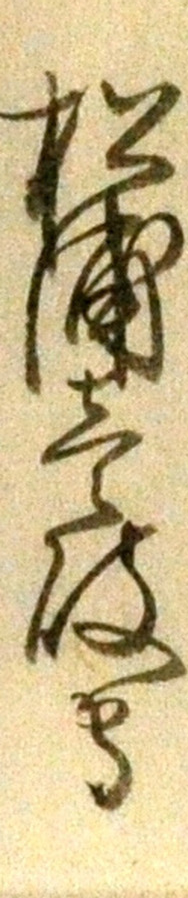松浦壱岐守
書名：御馳走御能ノ節ノ留外
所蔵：伊那市立高遠町図書館・合同会社AMANE
